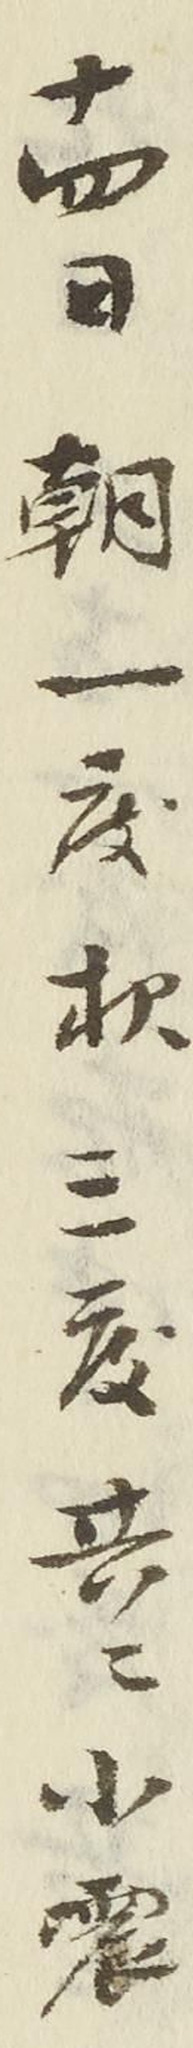十四日朝一度夜三度共二小震
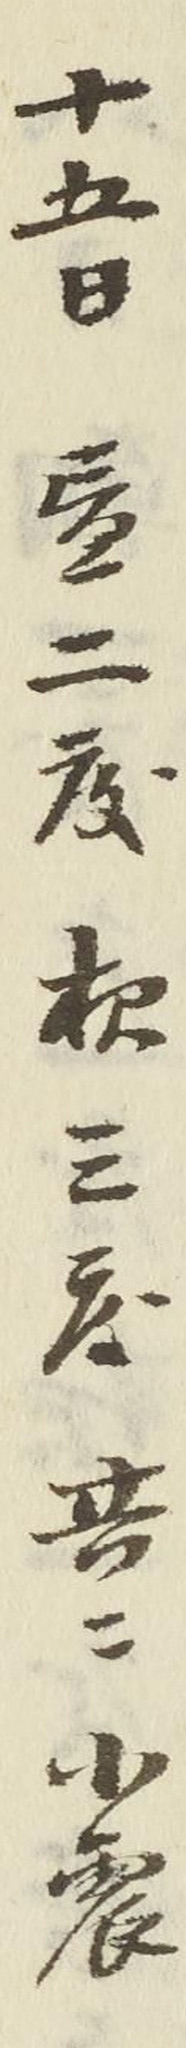十五日昼二度夜三度共二小震
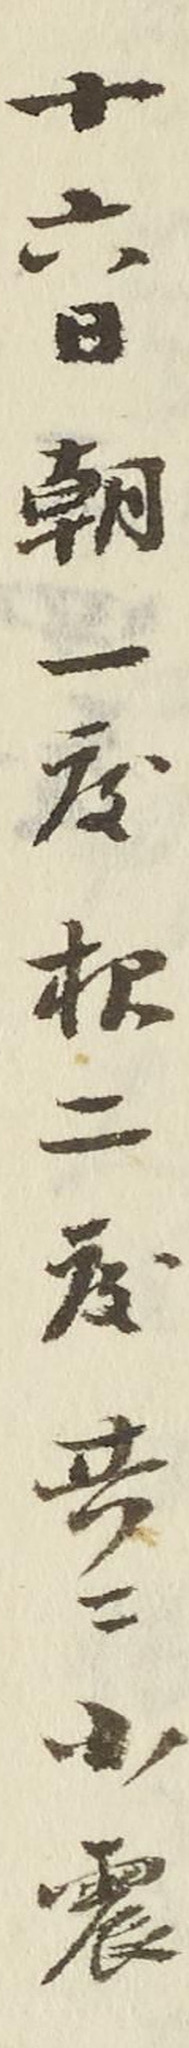十六日朝一度夜二度共二小震
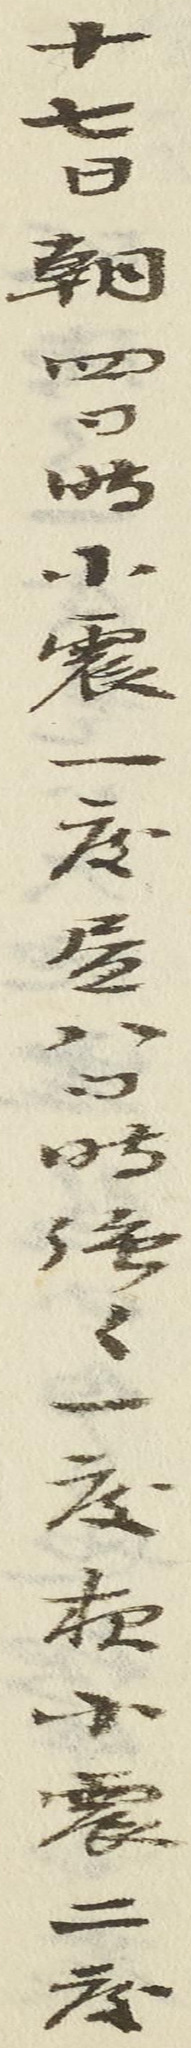十七日朝四ッ時小震一度昼八ッ時強く一度夜小震二度
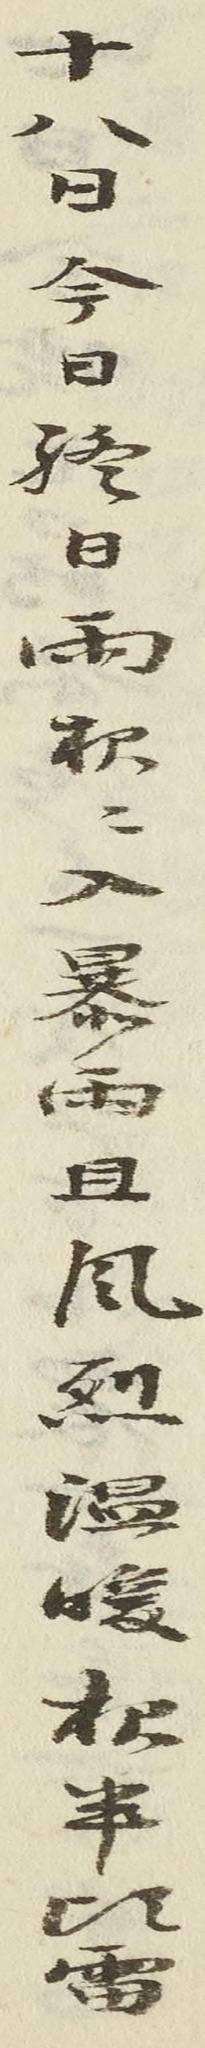十八日今日終日雨夜二入暴雨且風烈温暖夜半頃雷
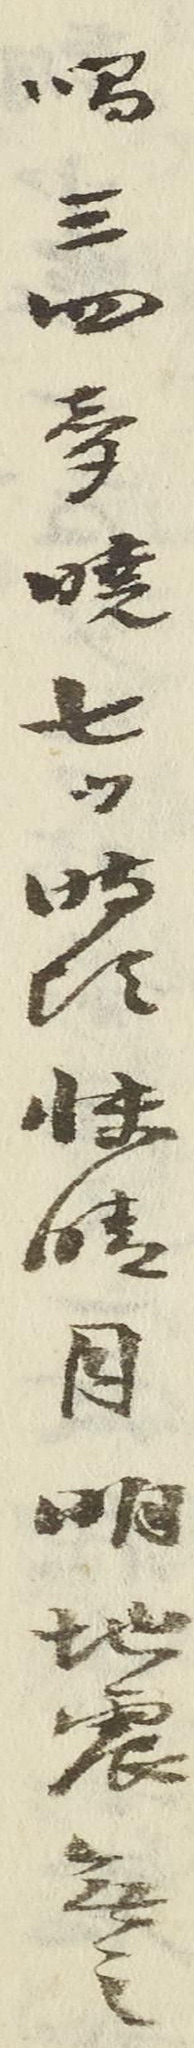鳴三四声暁七ッ時頃快晴月明地震無之
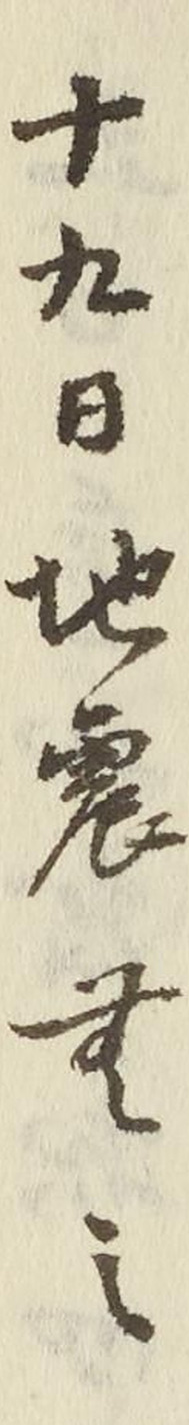十九日地震無之
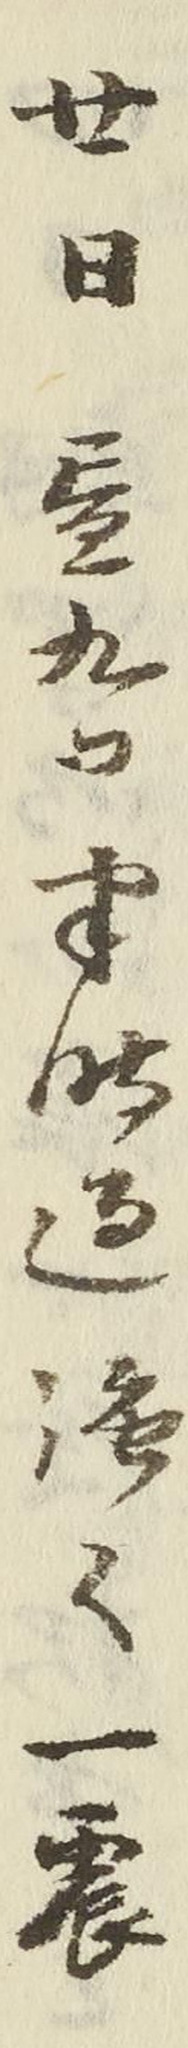廿日昼九ッ半時過強く一震
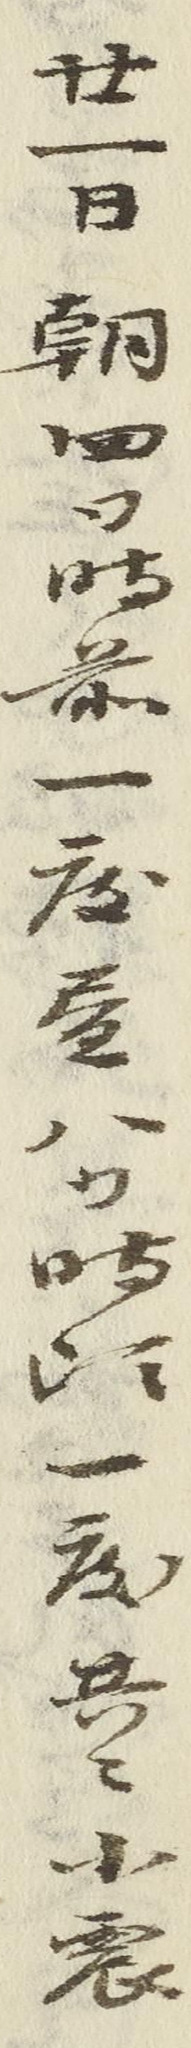廿一日朝四ッ時前一度昼八ッ時頃一度共二小震
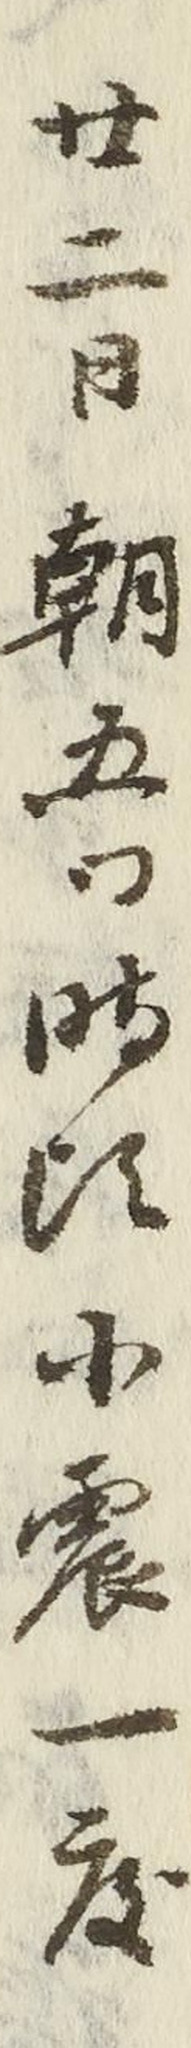廿二日朝五ッ時頃小震一度
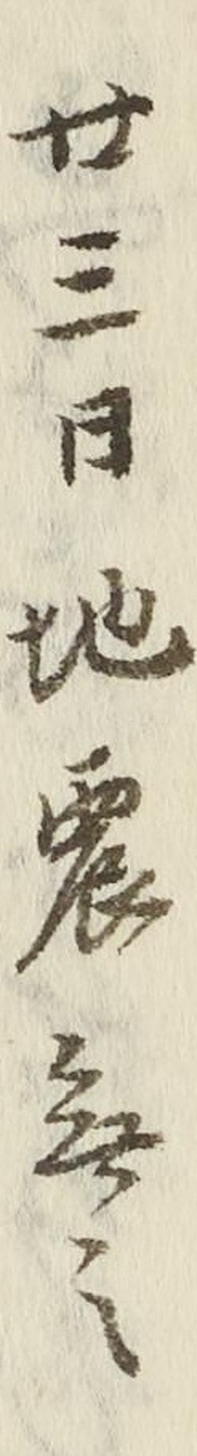廿三日地震無之
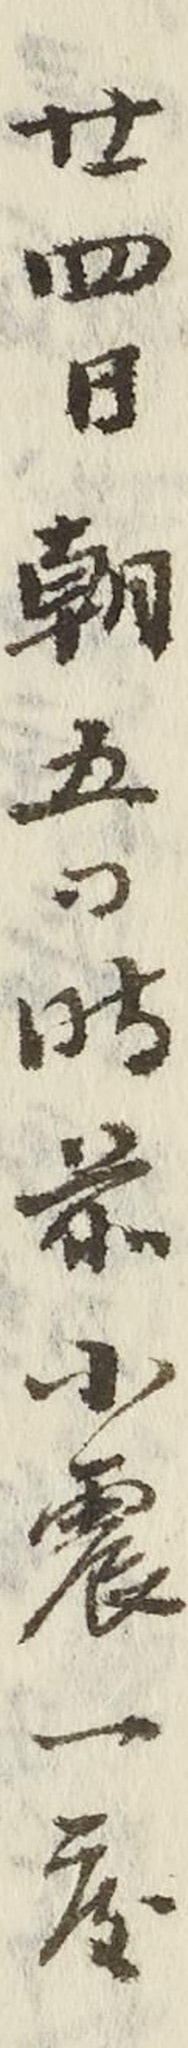廿四日朝五ッ時前小震一度
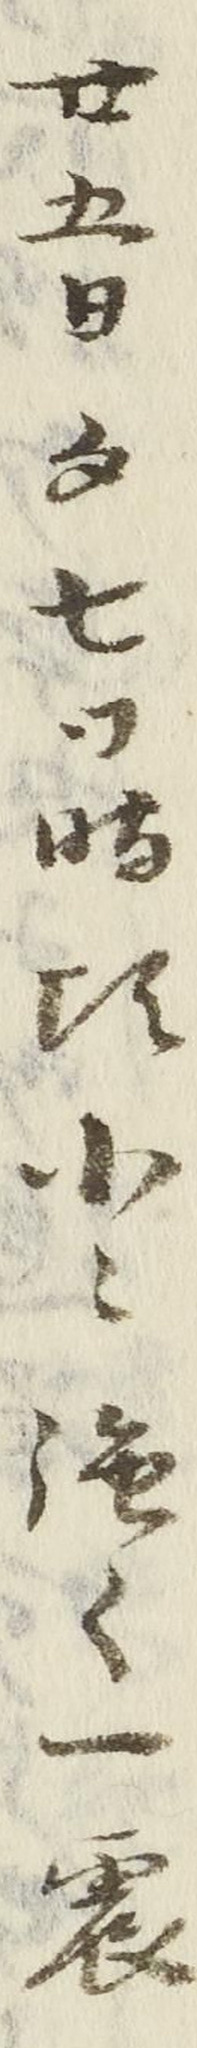廿五日夕七ッ時頃小々強く一震
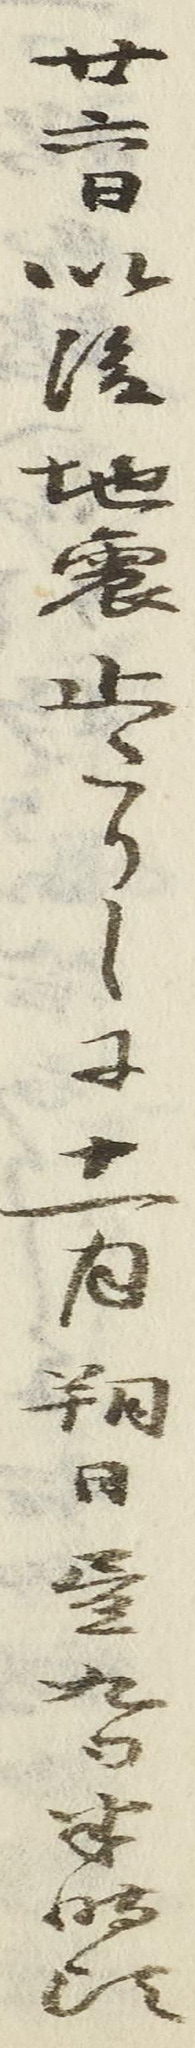廿六日以後地震止たりしに十一月朔日昼九ッ半時頃
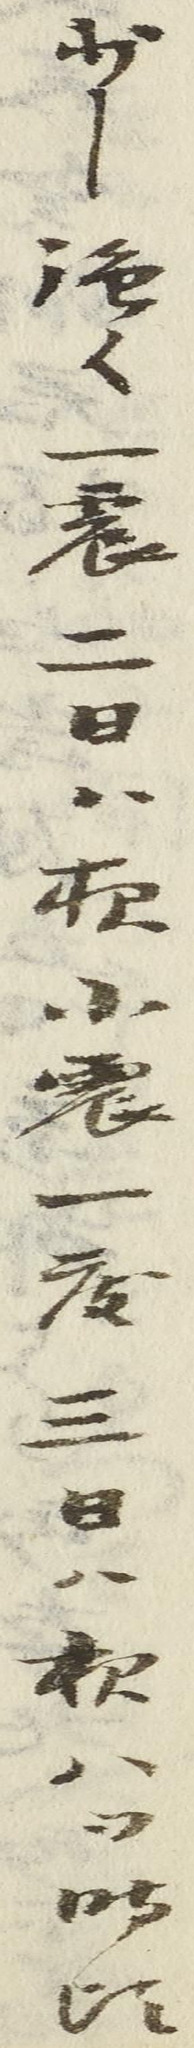少し強く一震二日ハ夜小震一度三日ハ夜八ッ時頃
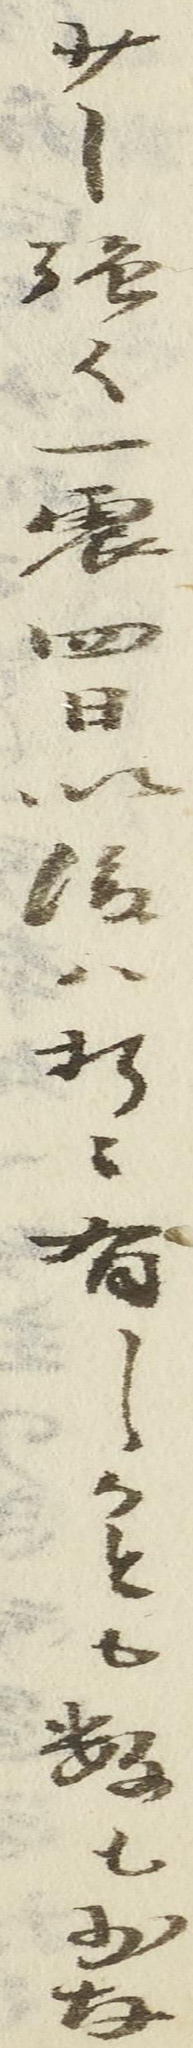少し強く一震四日以後ハ折々有しかとも数も少な
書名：那為の後見艸　全
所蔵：東京大学地震研究所図書室 Earthquake Research Institute Library, The University of Tokyo, JAPAN
